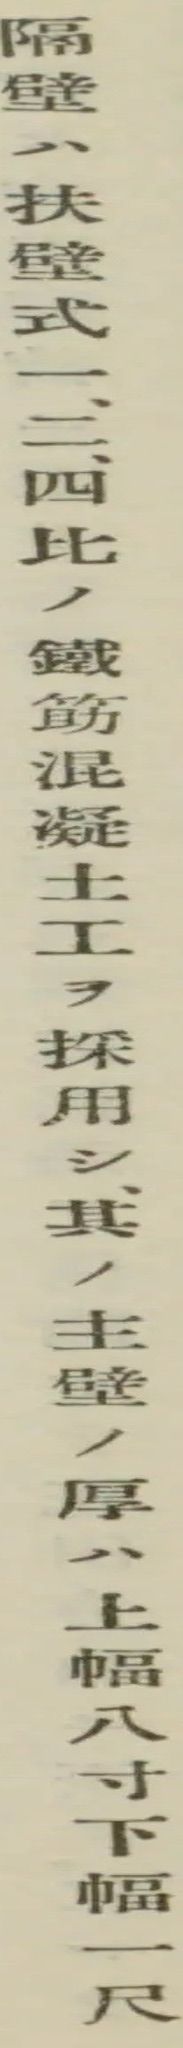隔壁は扶壁式一ニ、四比の鉄筋混凝土工を採用し、其の主壁の厚は上幅八寸下幅一尺
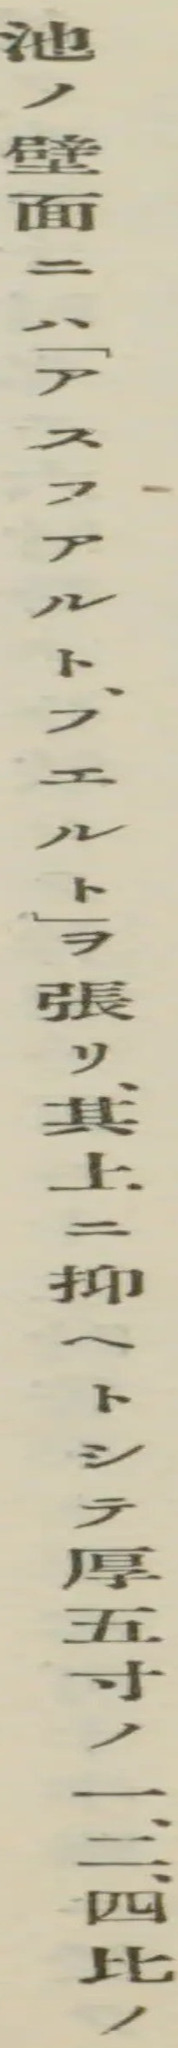池の壁面には「アスファルト、フエルト」を張り、其上に抑へとして厚五寸の一、二、四比の
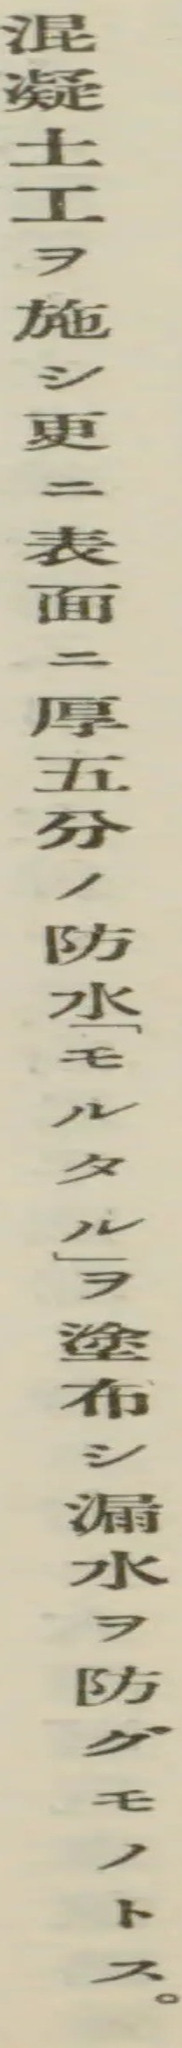混凝土工を施し更に表面に厚五分の防水「モルタル」を塗布し漏水を防ぐものとす、
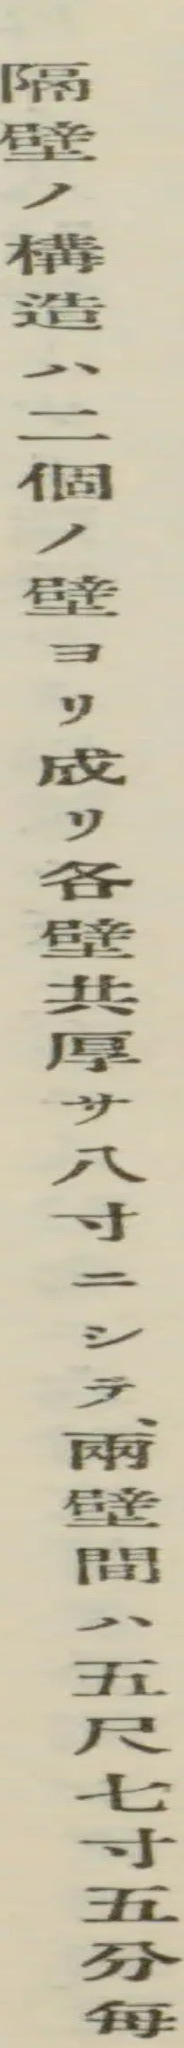隔壁の構造は二個の壁より成り各壁共厚さ八寸にして、両壁間は五尺七寸五分毎
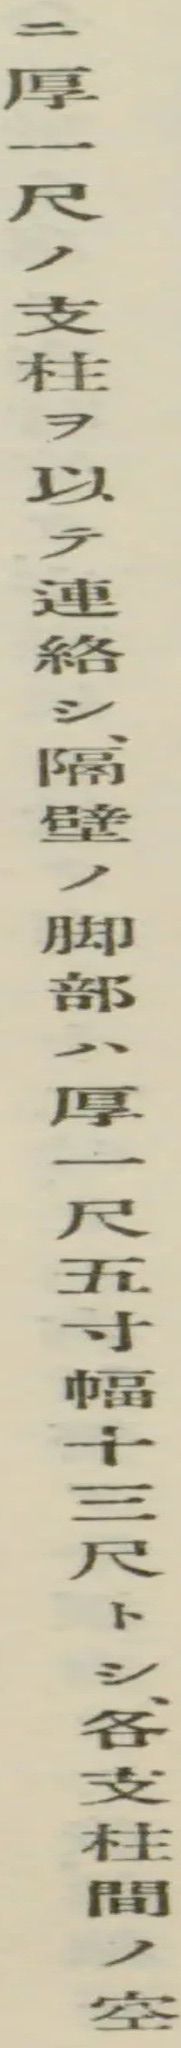に厚一尺の支柱を以て連絡し、隔壁の脚部は厚一尺五寸幅十三尺とし、各支柱間の空
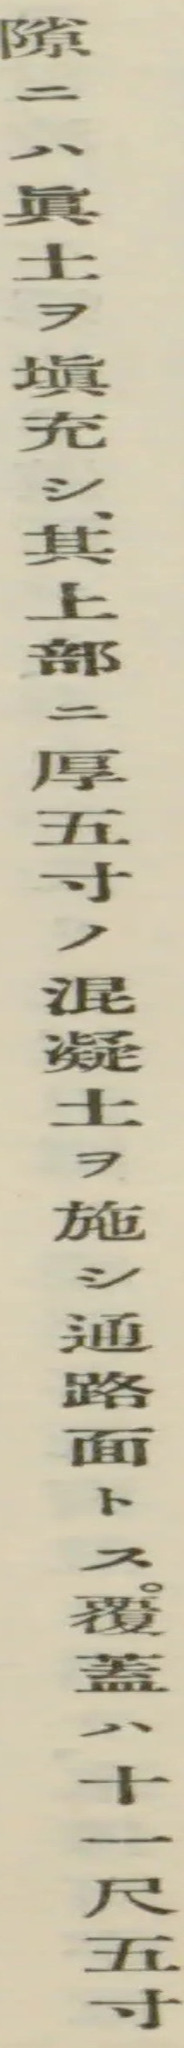隙には眞土を填充し、其上部に厚五寸の混凝土を施し通路面とす覆蓋は十一尺五寸
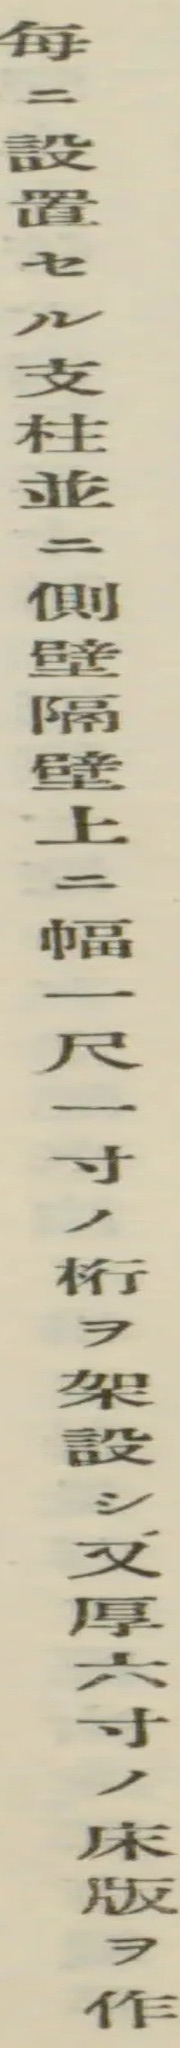毎に設置せる支柱並に側壁隔壁上に幅一尺一寸の桁を架設し、又厚六寸の床版を作
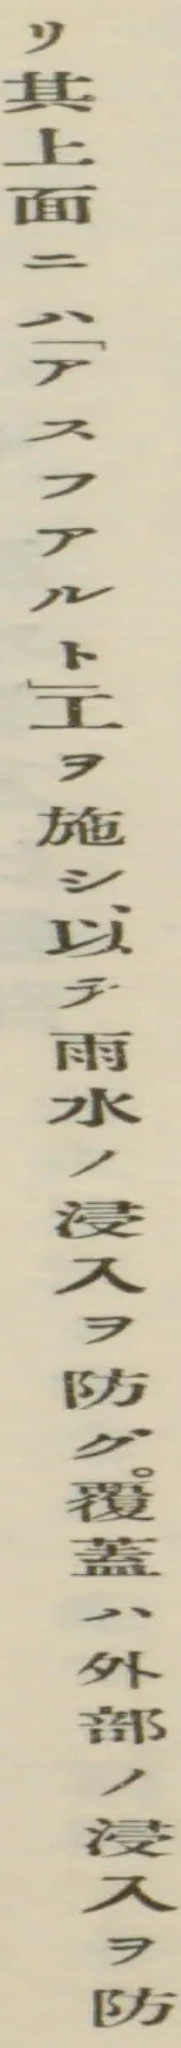り其上面には「アスファルト」工を施し、以て雨水の侵入を防ぐ。覆蓋は外部の侵入を防
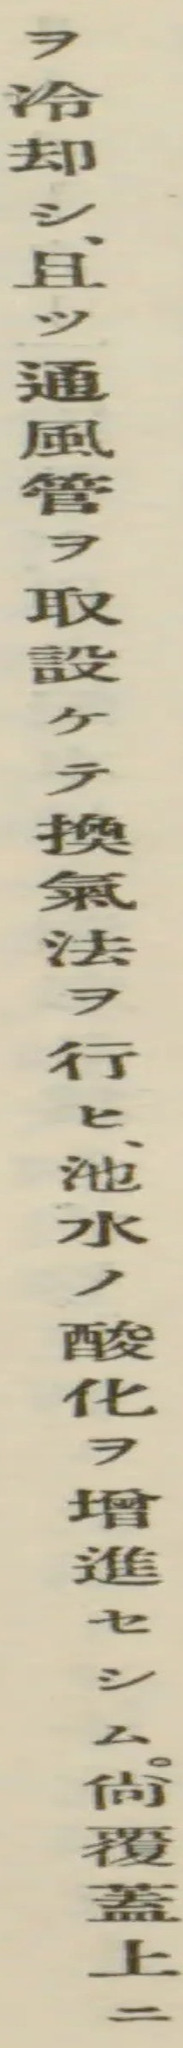を冷却し、且つ通風管を取設けて換気法を行ひ、池水の酸化を増進せしむ。尚覆蓋上に
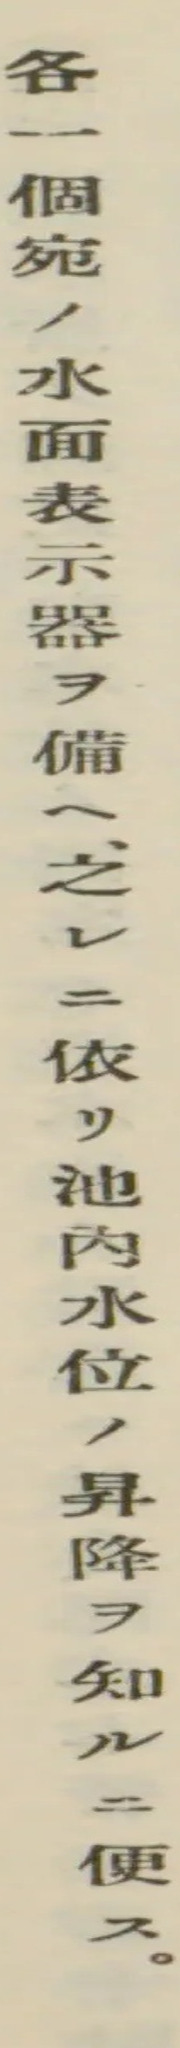各一個宛の水面標示器を備へ、之れをに依り池内水位の昇降を知るに便す。
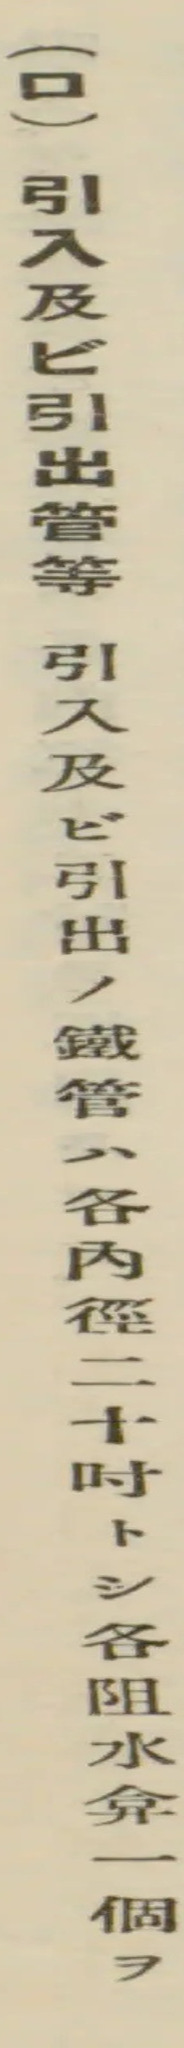(ロ)引入及び引出管等引入及び引出の鉄管は各内径二十吋とし各阻水弇一個を
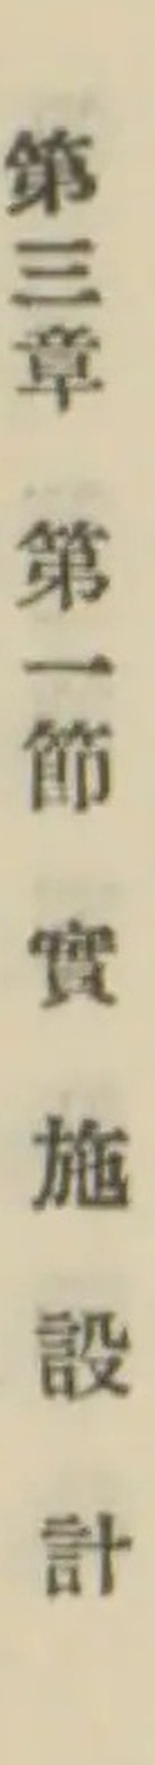第三章第一節実施設計

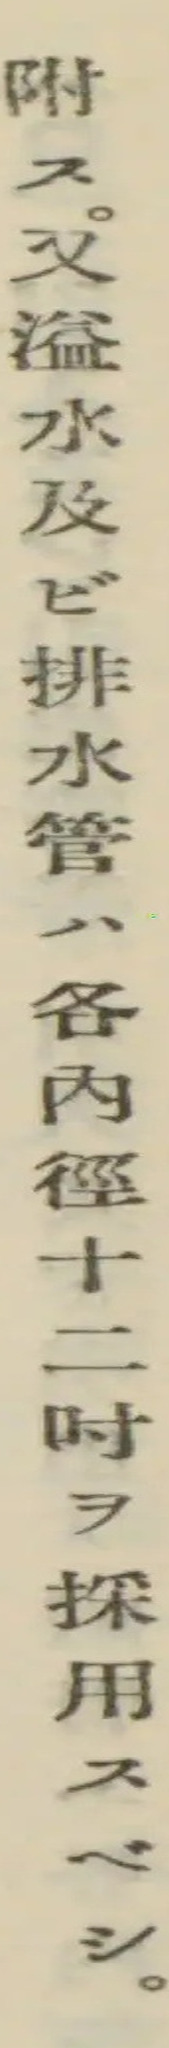附す。又溢水お及び排水管は各内径十二吋を採用すべし、
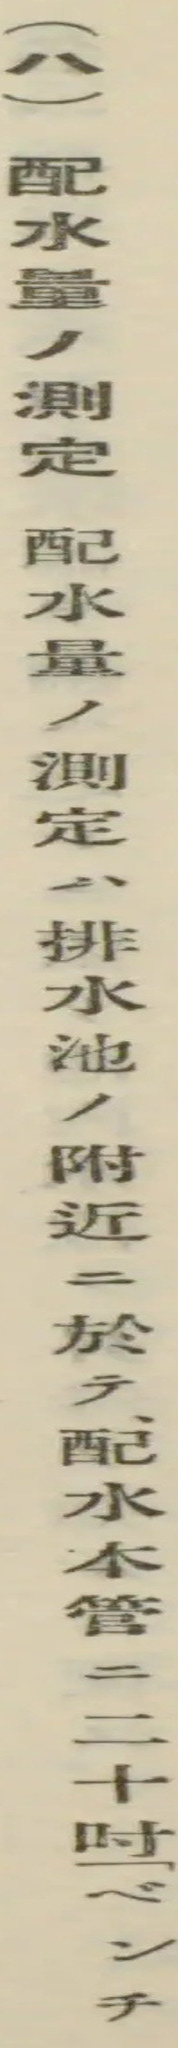(ハ)配水量の測定配水量の測定は排水池の附近に於て、配水本管に二十吋「ベンチ
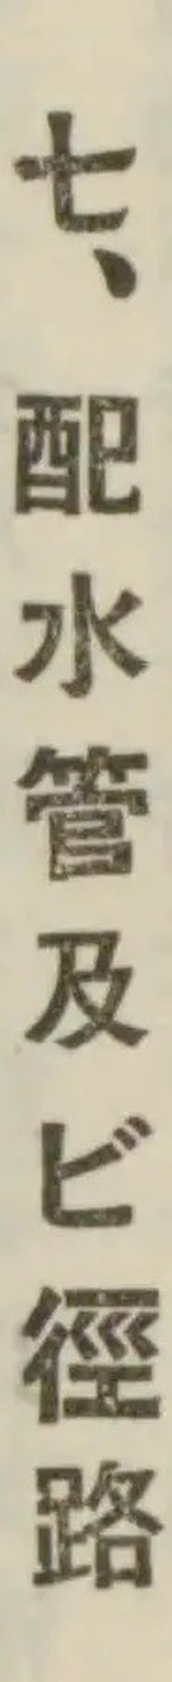七、排水管及び経路
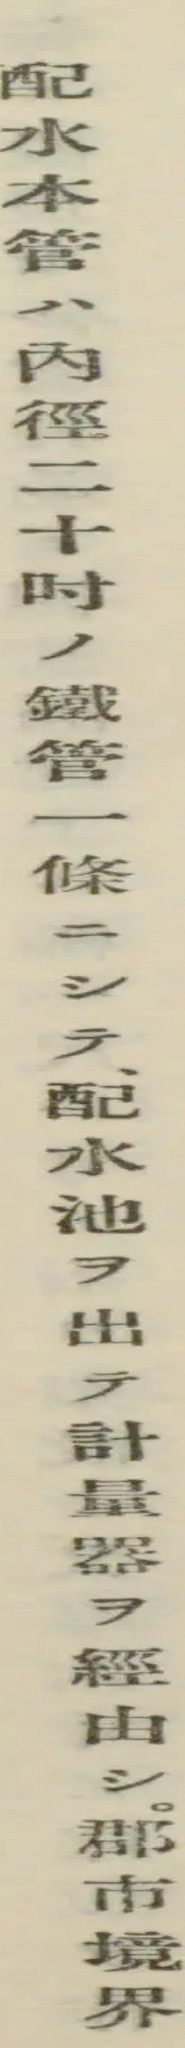配水本管は内径にじゅう二十吋の鉄管一條にして、配水池を出て計量器を経由し。郡市境界
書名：豊橋市水道誌
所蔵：国立国会図書館 National Diet Library, JAPAN
